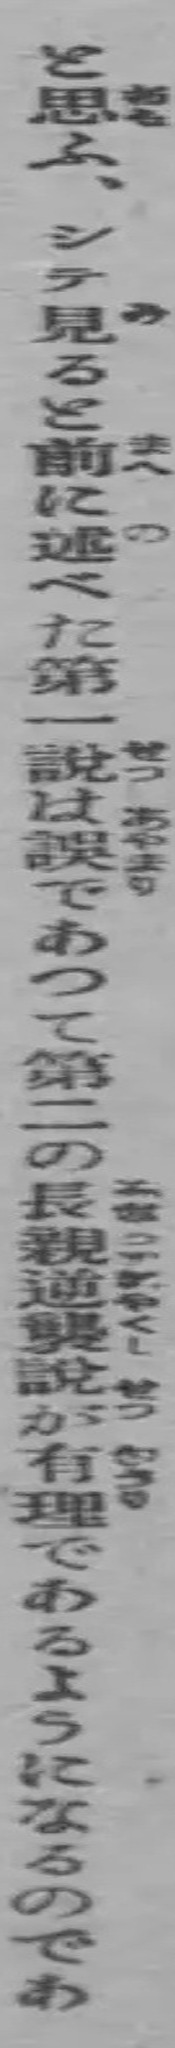と思ふ、シテ見ると前に述べた第一説は誤であつて第二の長親逆襲説が有理であるようになるのであ
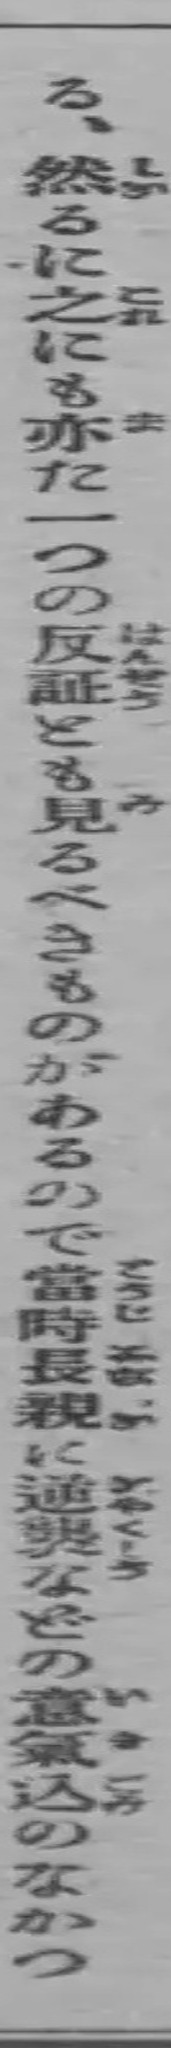る、然るに之にも亦た一つの反証とも見るべきものがあるので当時長親に逆襲などの意気込のなかつ
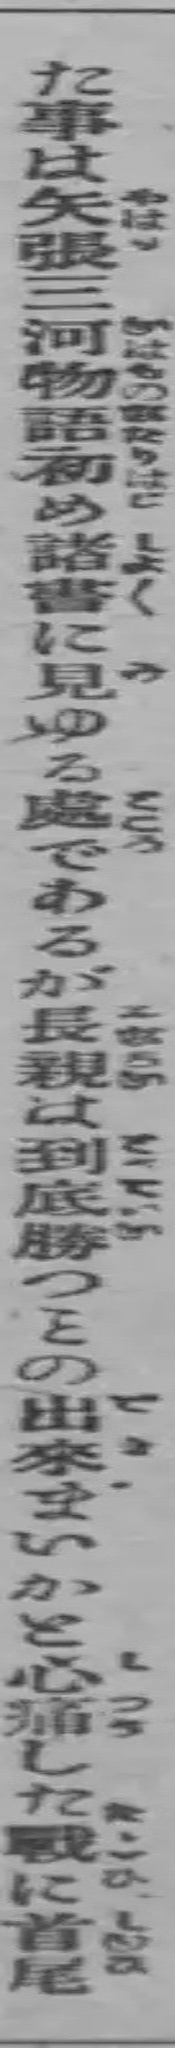た事は矢張三河物語初め諸書に見ゆる処であるが長親は到底勝つことの出来まいかと心痛した戦に首尾
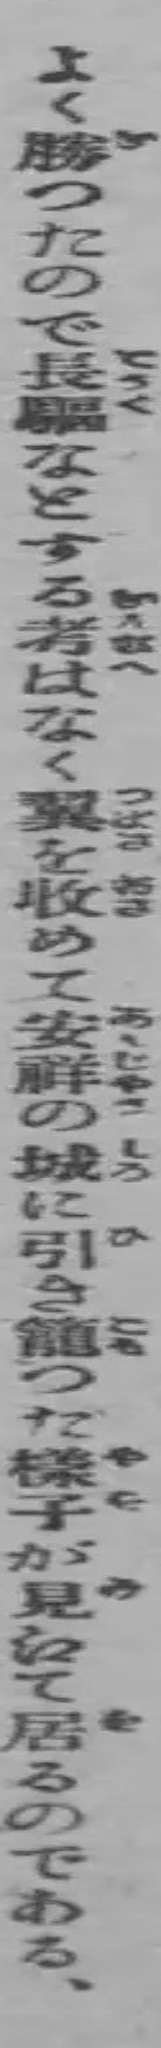よく勝つたので長駆なとする考はなく翼を収めて安祥の城に引き籠つた様子が見えて居るのである、
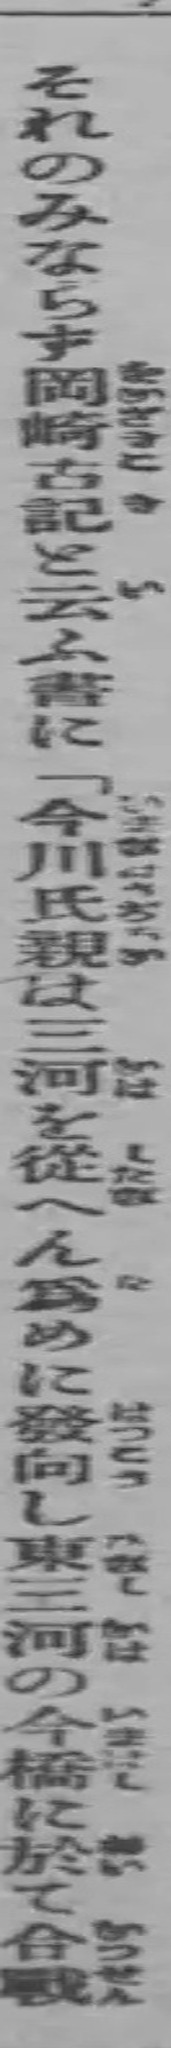岡崎古記それのみならず岡崎古記と云ふ書に「今川氏親は三河を従へん為めに発向し東三河の今橋に於て合戦
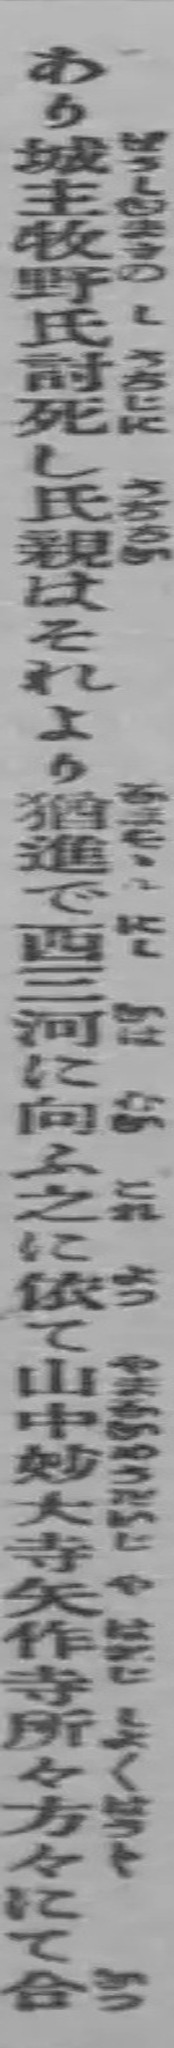あり城主牧野氏討死し氏親はそれより猶進で西三河に向ふ之に依て山中妙大寺矢作寺所々方々にて合
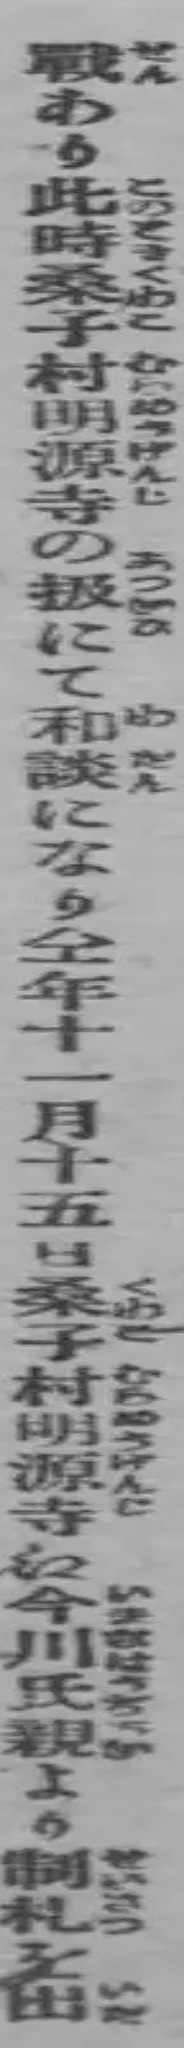戦あり此時桑子村明源寺の扱にて和談になり仝年十一月十五日桑子村明源寺え今川氏親より制札を出
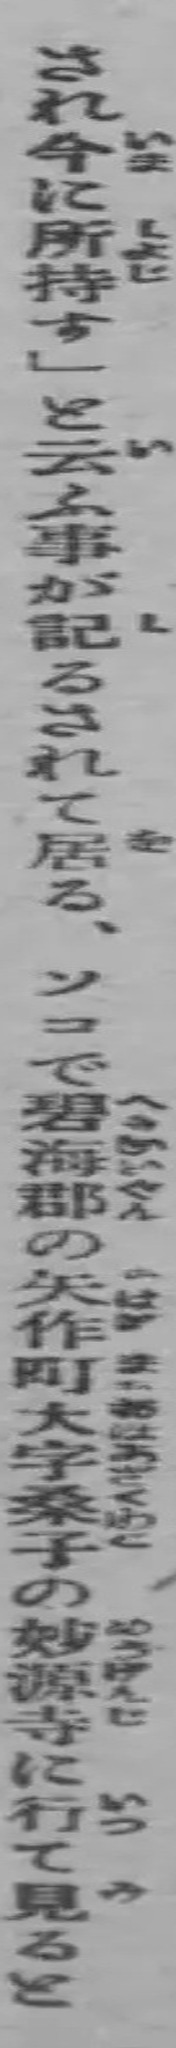妙源寺文書され今に所持す」と云ふ事が記るされて居る、ソコで碧海郡の矢作町大字桑子の妙源寺に行て見ると
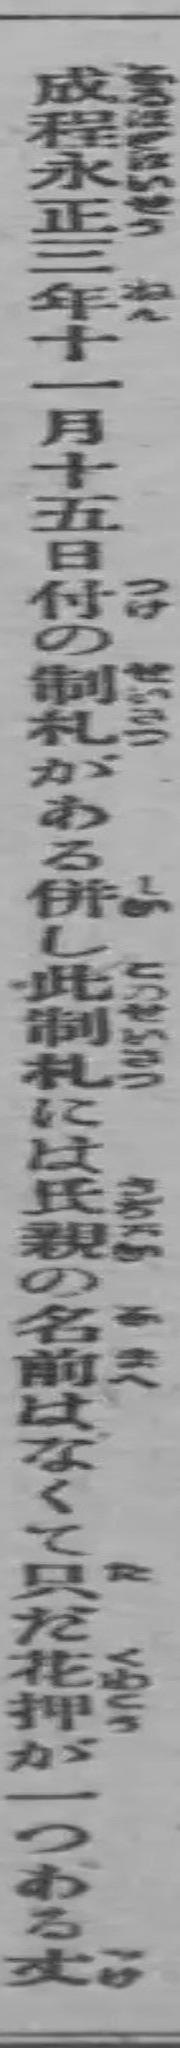成程永正三年十一月十五日付の制札がある併し此制札には氏親の名前はなくて只だ花押が一つある丈
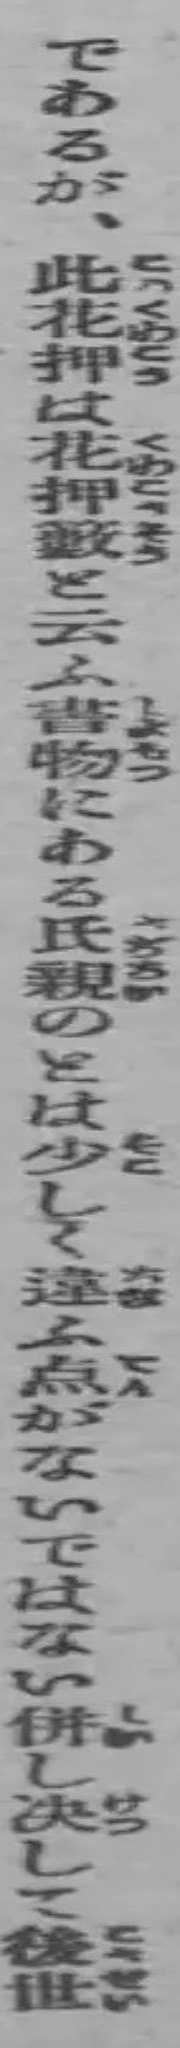であるが、此花押は花押籔と云ふ書物にある氏親のとは少しく違ふ点がないではない併し決して後世
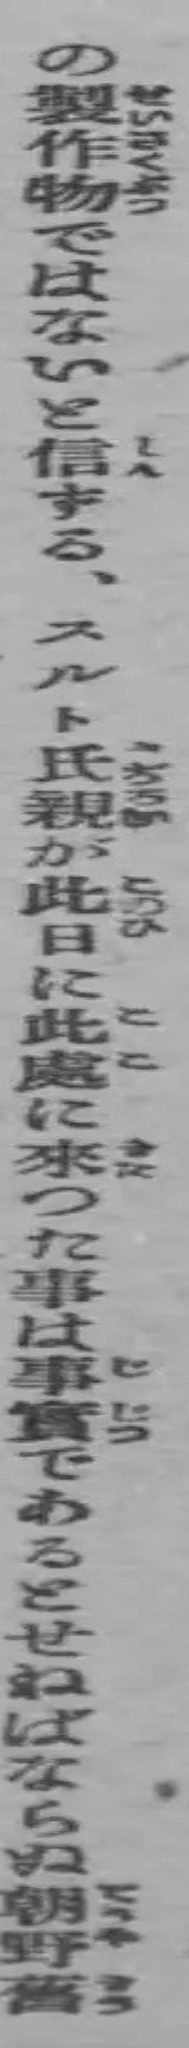の製作物ではないと信ずる、スルト氏親が此日に此処に来つた事は事実であるとせねばならぬ朝野旧
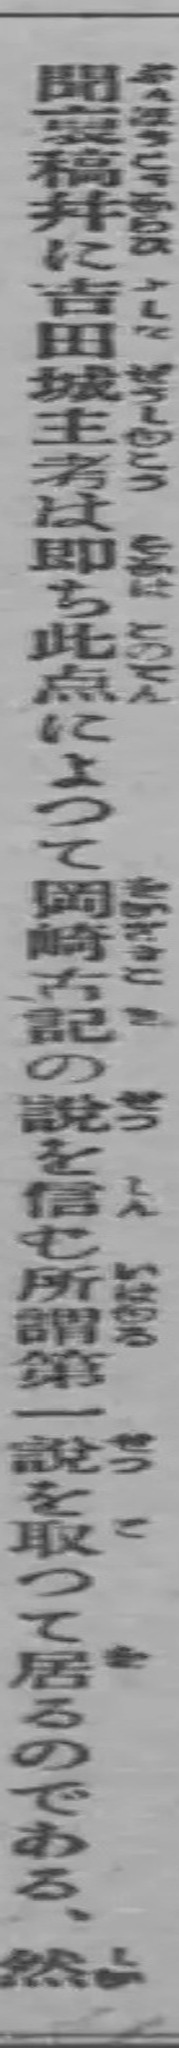聞裒稿幷に吉田城主考は即ち此点によつて岡崎古記の説を信じ所謂第一説を取つて居るのである、然
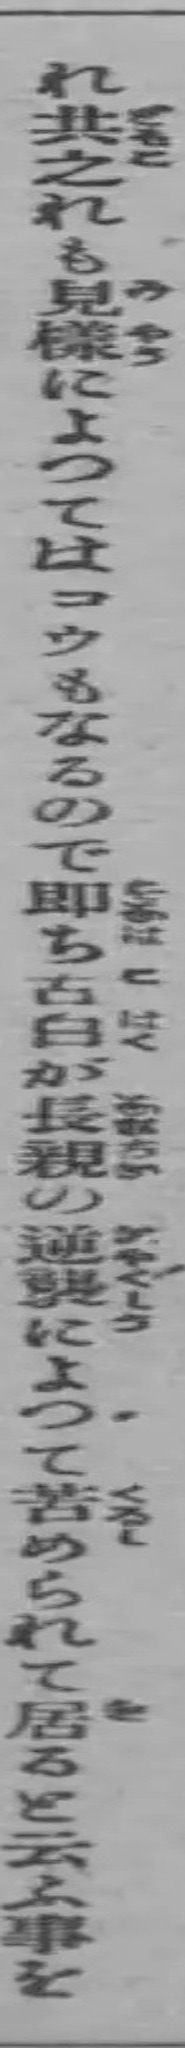れ共之れも見様によつてはコウもなるので即ち古白が長親の逆襲によつて苦められて居ると云ふ事を
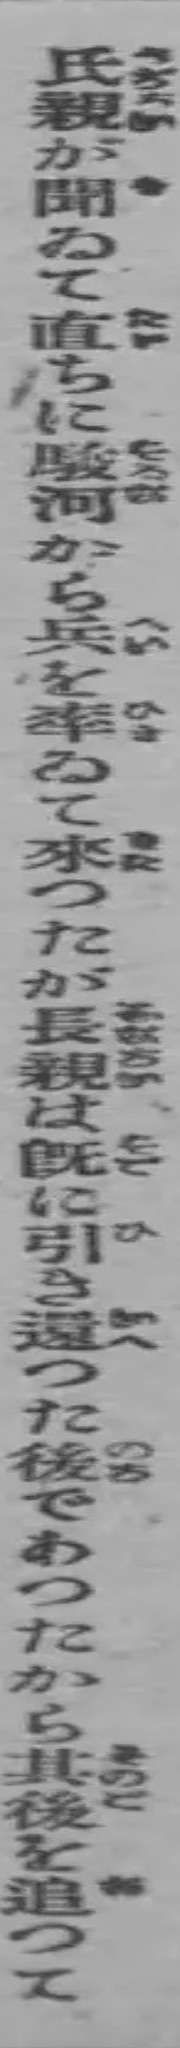氏親が聞ゐて直ちに駿河から兵を率ゐて来つたが長親は既に引き還つた後であつたから其後を追つて
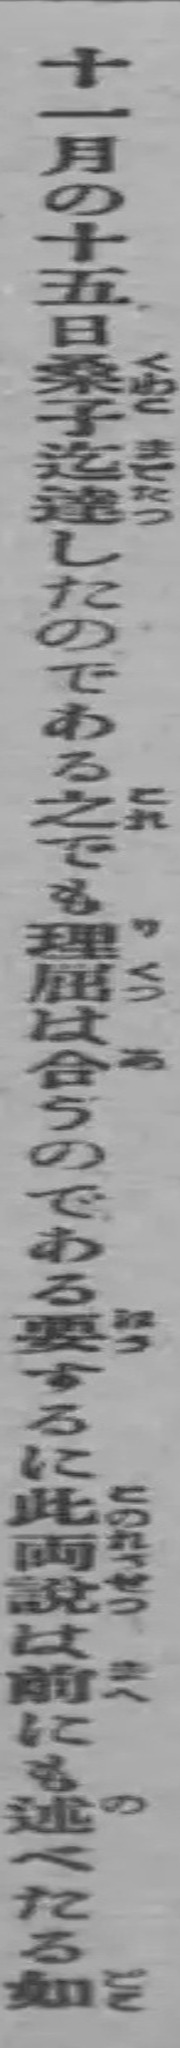十一月の十五日桑子迄達したのである之でも理屈は合うのである要するに此両説は前にも述べたる如
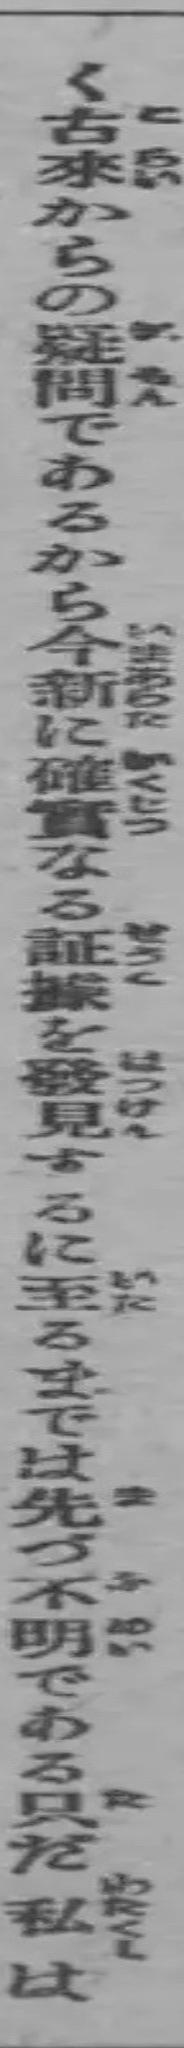く古来からの疑問であるから今新に確実なる証拠を発見するに至るまでは先づ不明である只だ私は
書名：豊橋市史談
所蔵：国立国会図書館 National Diet Library, JAPAN
